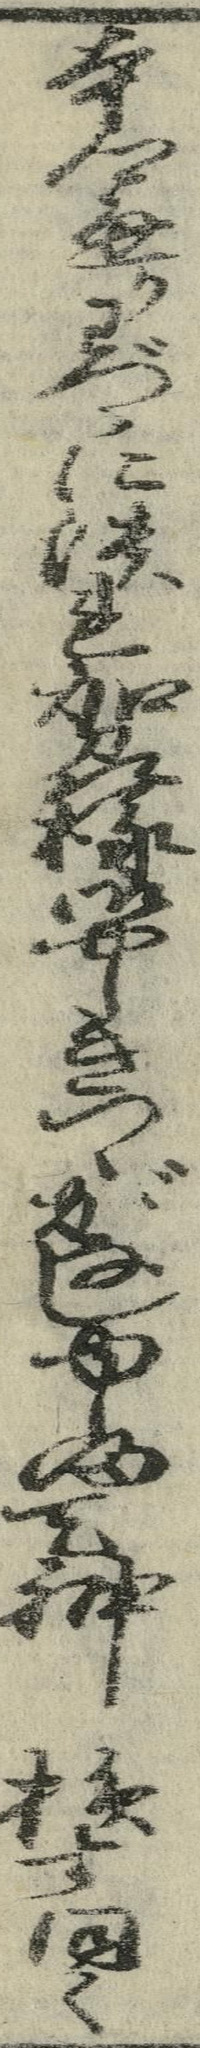本郷通りわづかに潰れ加州様御やしきつゝがなしゆしま天神損す同く
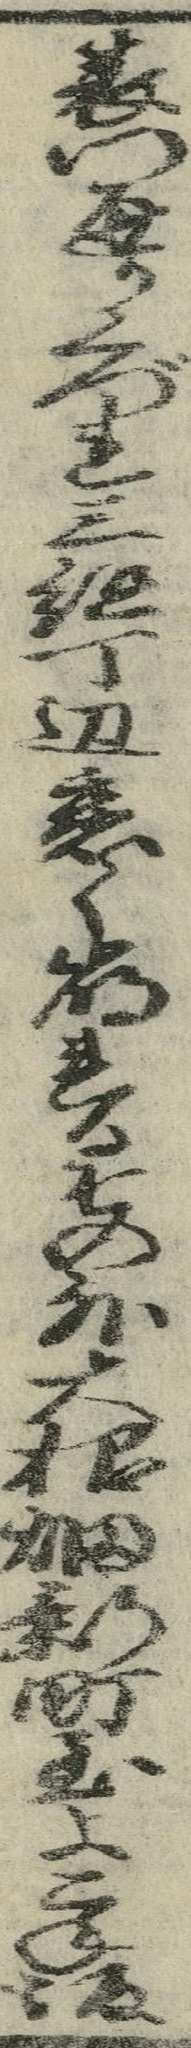表門通りくづれ三組丁辺悉く崩れるその外大根畑新町至上二年坂
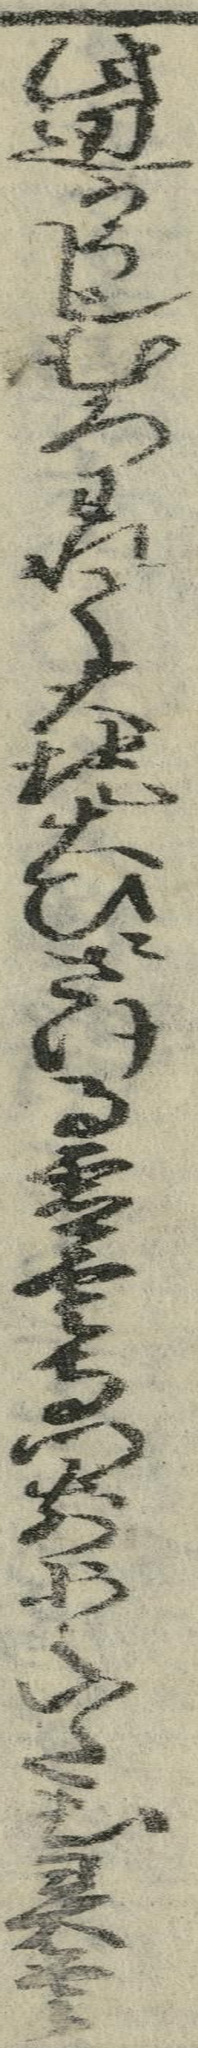此辺かうじむろわれて大地大ひにさける霊雲寺門前少々いたむ霊雲
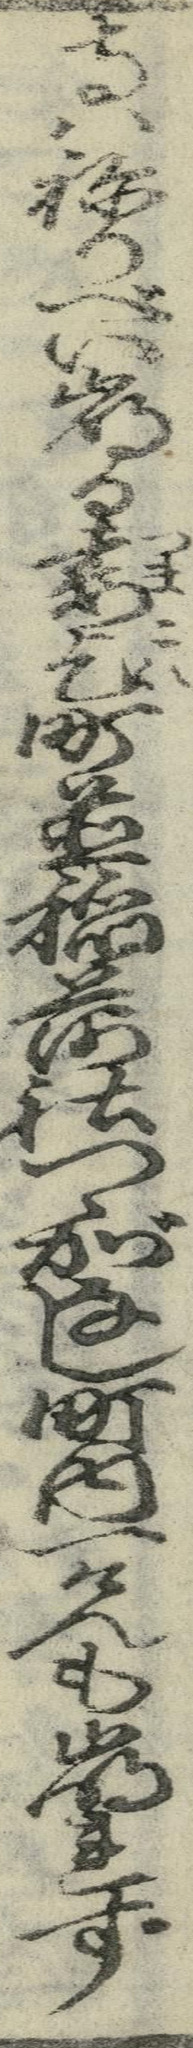寺はねりべい崩る妻乞町並稲荷社つゝがなし町内一けんも崩れず
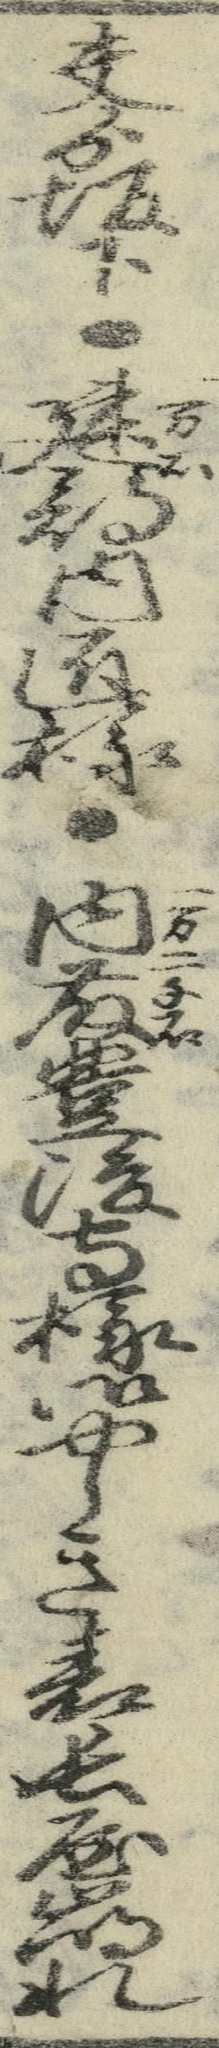夫ゟ坂下●建部内匠様●内藤豊後守様御中やしき表長屋崩れ
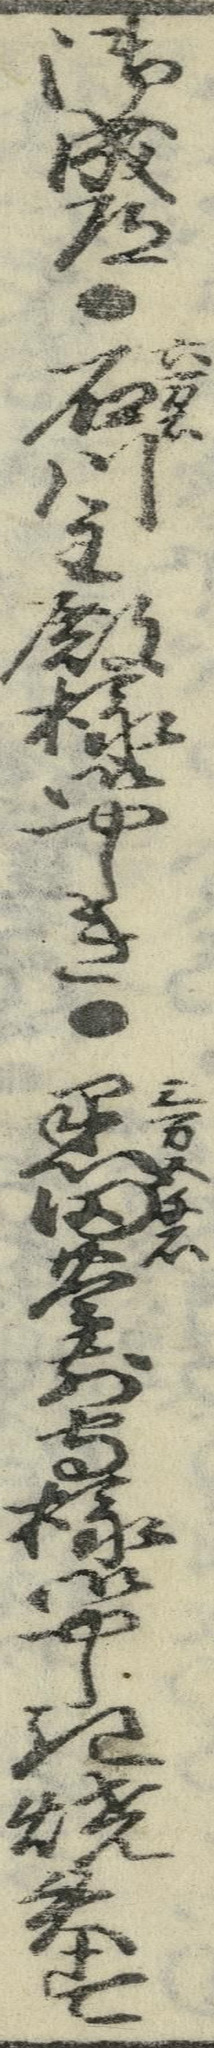御成道●石川主殿様御中やしき●黒田豊前守様御やしき焼失す
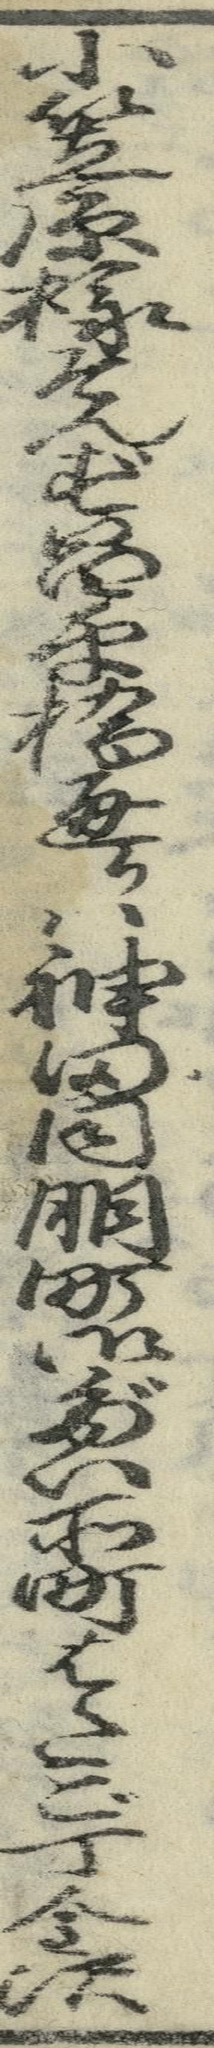小笠原様そんず昌平橋通りは神田同朋町御だい所町はたご丁金沢
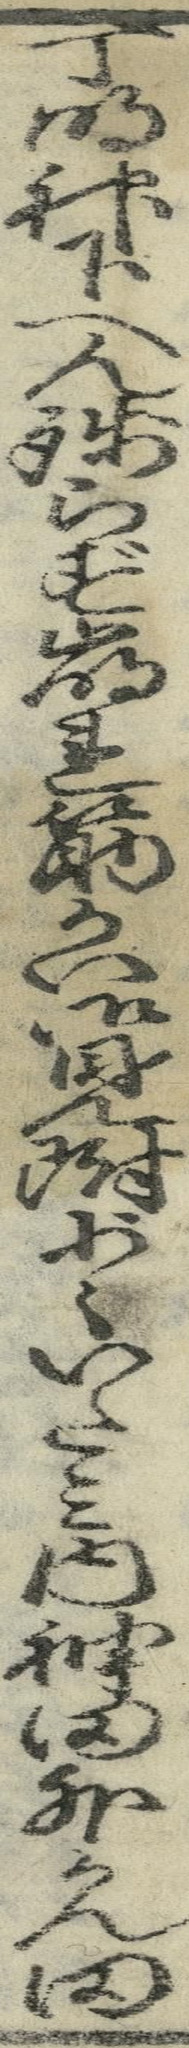丁明神下へん残らず崩れ筋かい御見附少々いたみ内神田外かん田
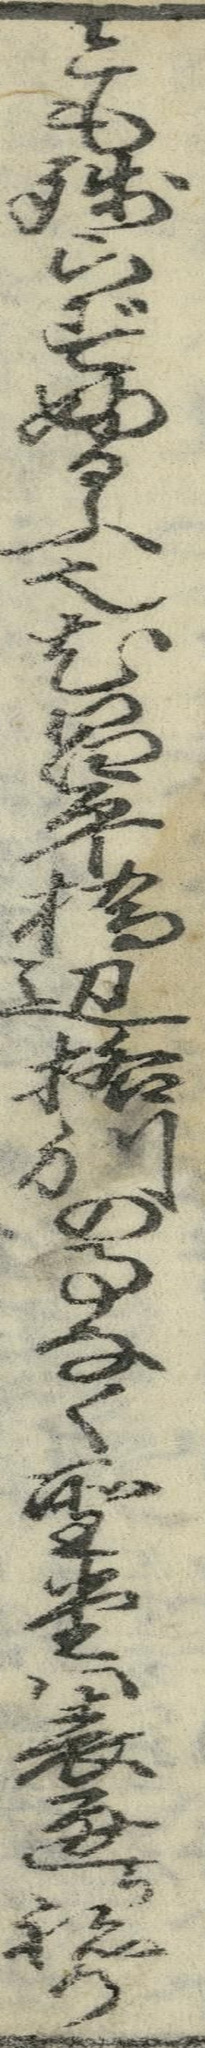とも残らずふるふ也尤昌平橋辺格別の事なく聖堂は表通りねり
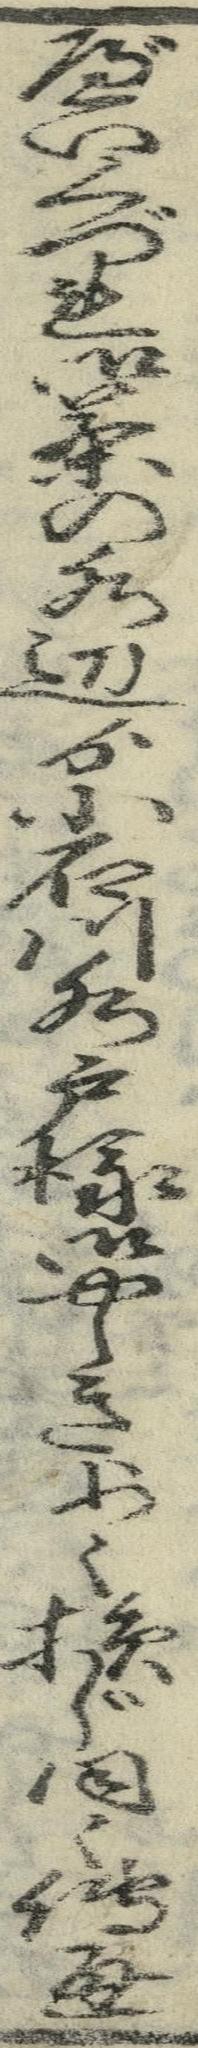べいくづれ御茶の水辺ゟ小石川水戸様御やしき少々損じ同く伝通
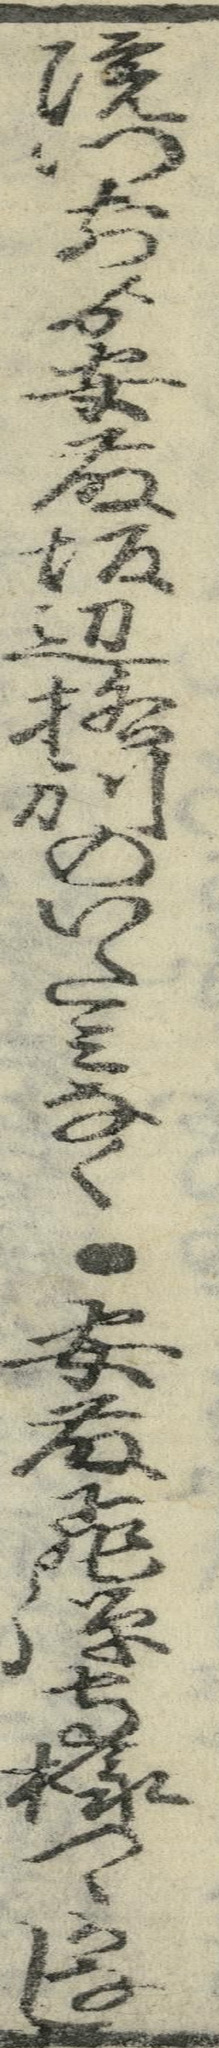院門前ゟ安藤坂辺格別のいたみなく●安藤飛騨守様つゝかなし
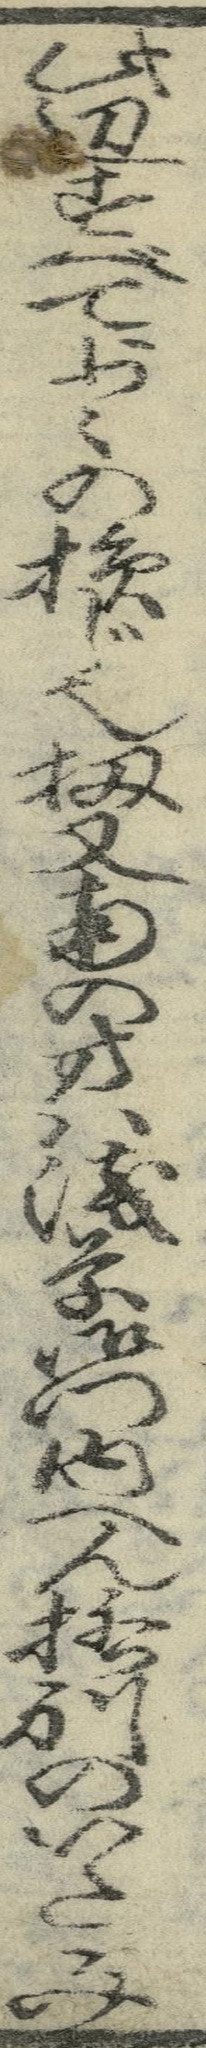此辺すべて少々の損じ也扨又南の方は浅草御門内へん格別のいたみ
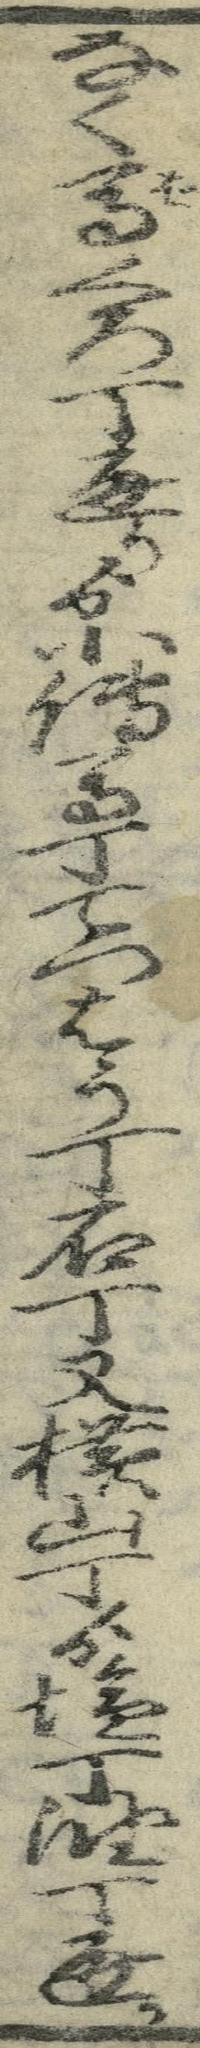なく馬くろ丁通りゟ小伝馬丁てつはう丁石丁又横山丁ゟ塩丁油丁通り

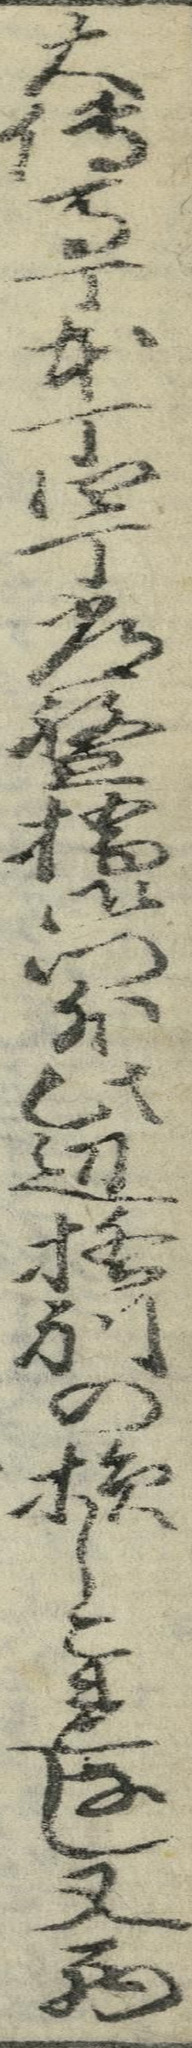大伝馬丁本丁四丁常磐橋御門外此辺格別の損しこれなし又西
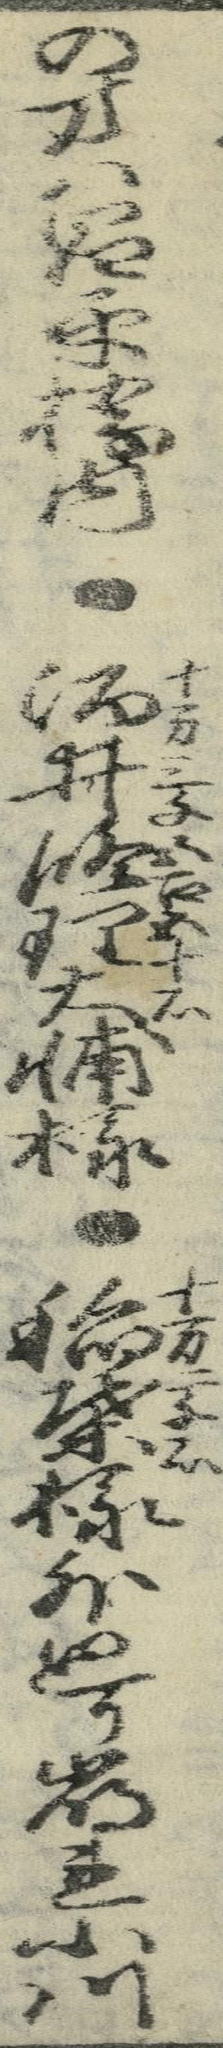の方ハ昌平橋内●酒井修理大輔様●稲葉様外廻り崩れ小川
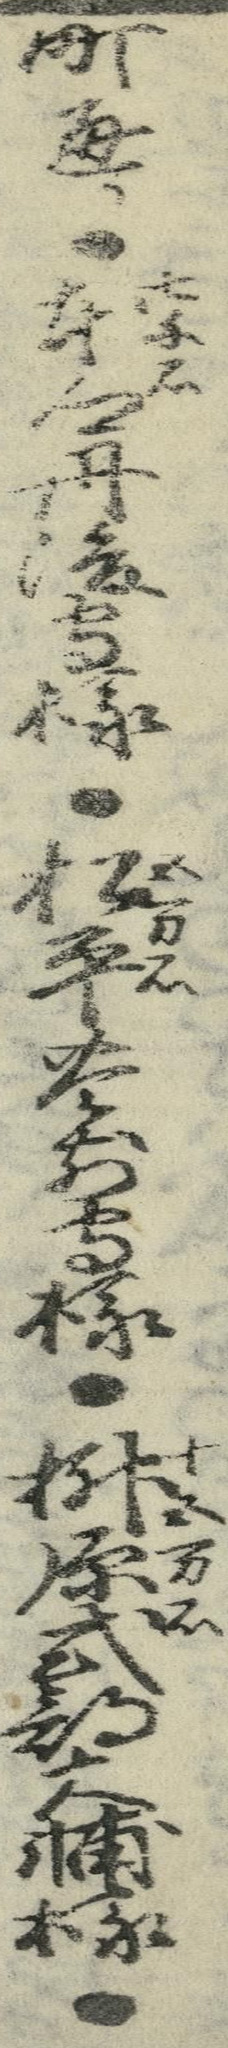町通り●本郷丹後守様●松平豊前守様●榊原式部大輔様●
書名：安政息災記　全
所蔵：東京大学地震研究所図書室 Earthquake Research Institute Library, The University of Tokyo, JAPAN
